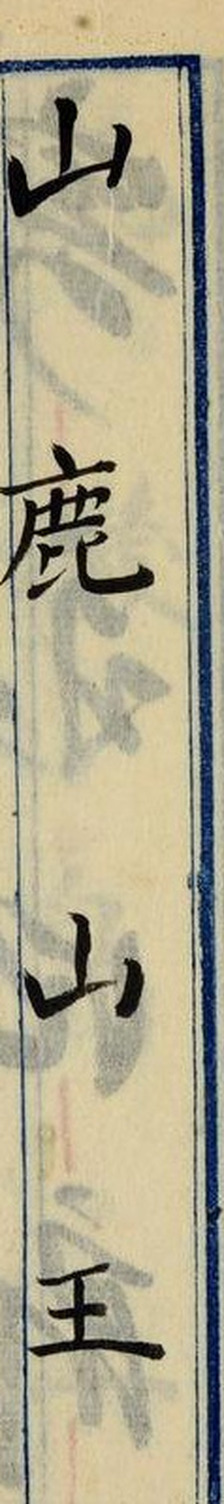山鹿山王
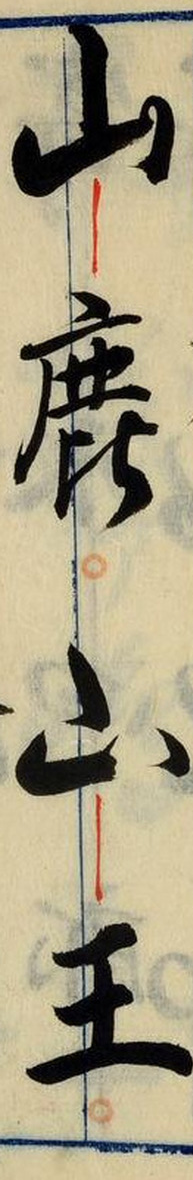山鹿山王
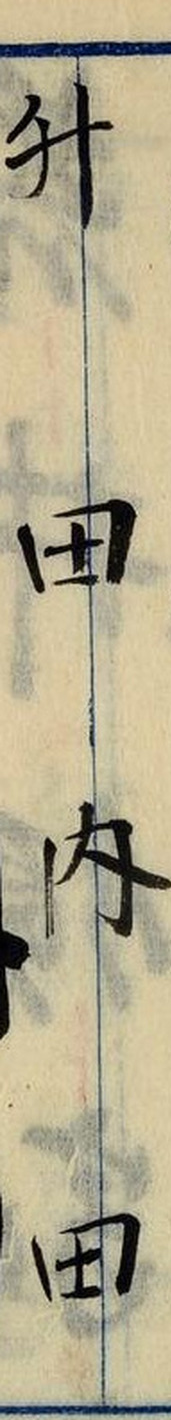升田内田
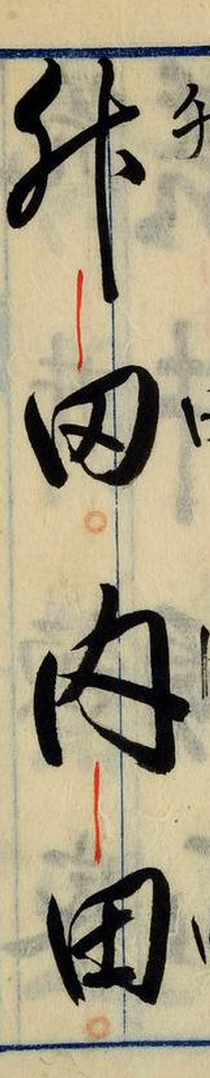升田内田

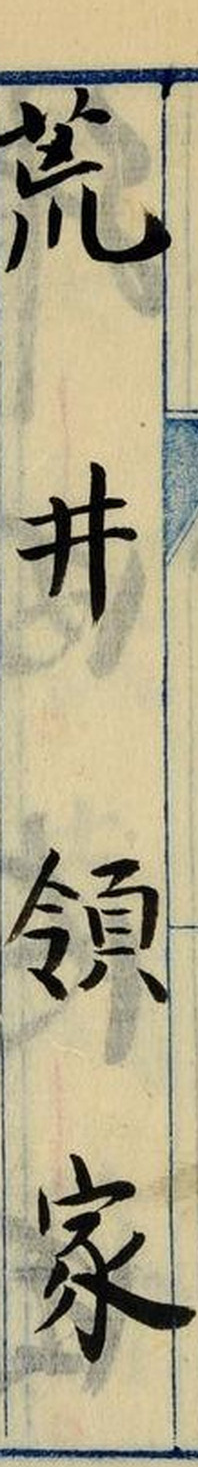荒井領家
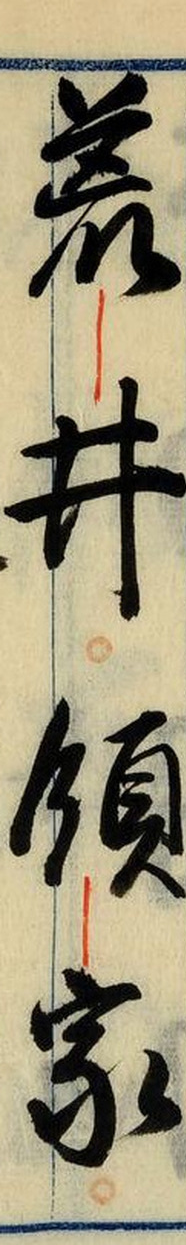荒井領家
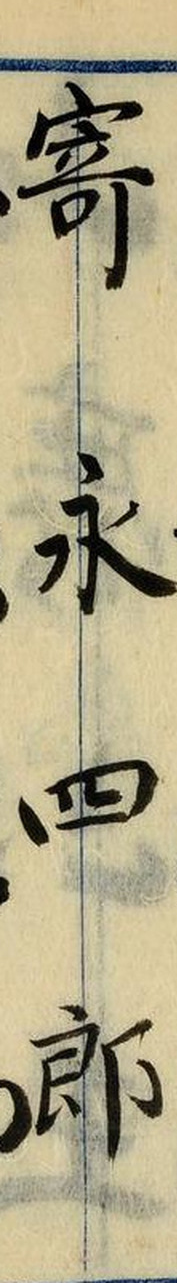寄永四郎
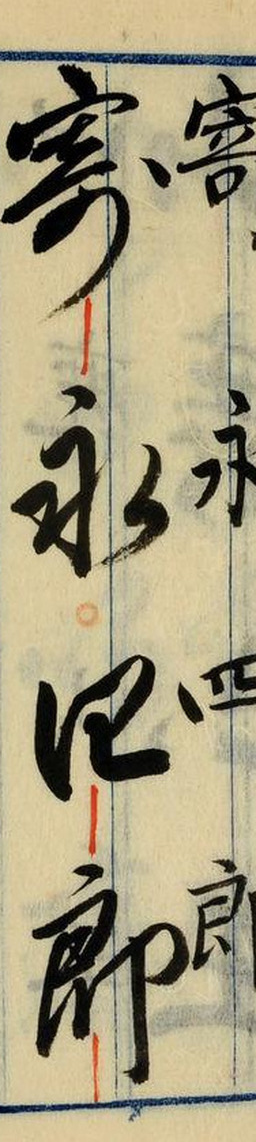寄永四郎
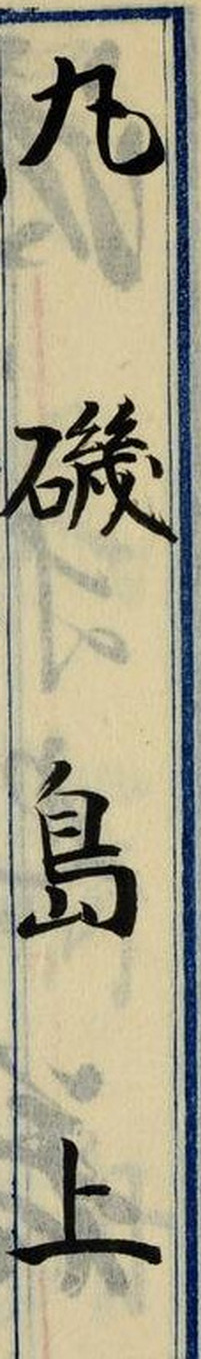丸磯島上
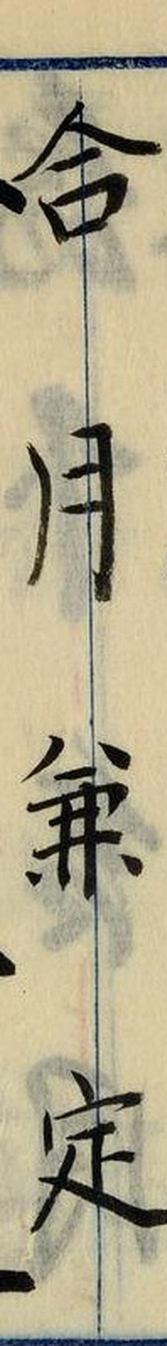合月兼定
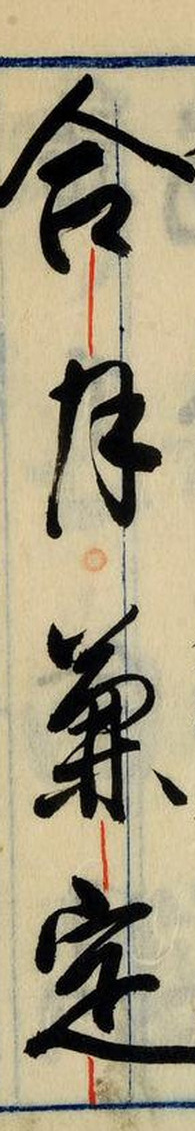合月兼定

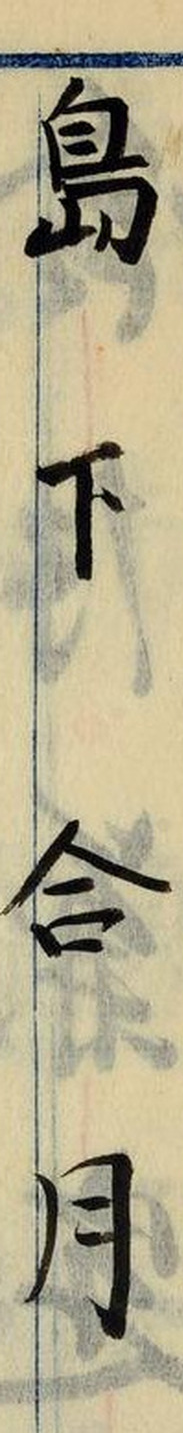島下合月
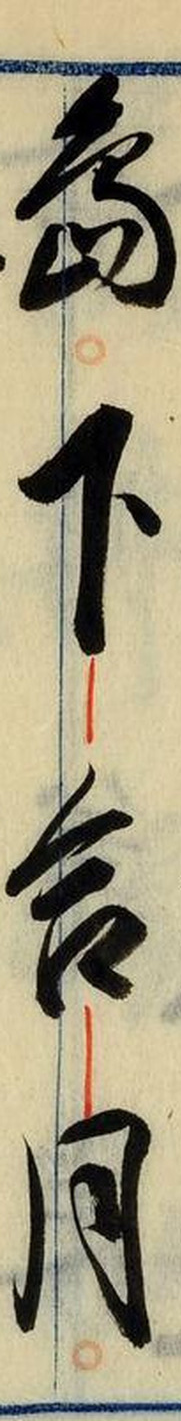島下合月
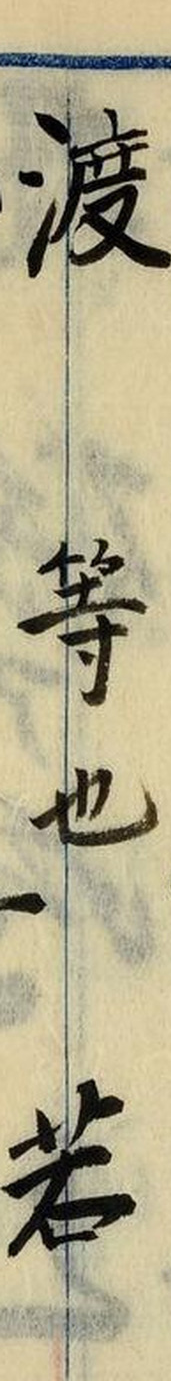渡等也若
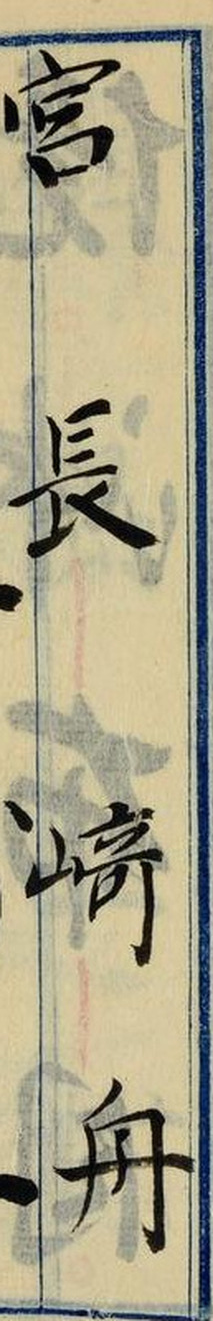宮長崎舟
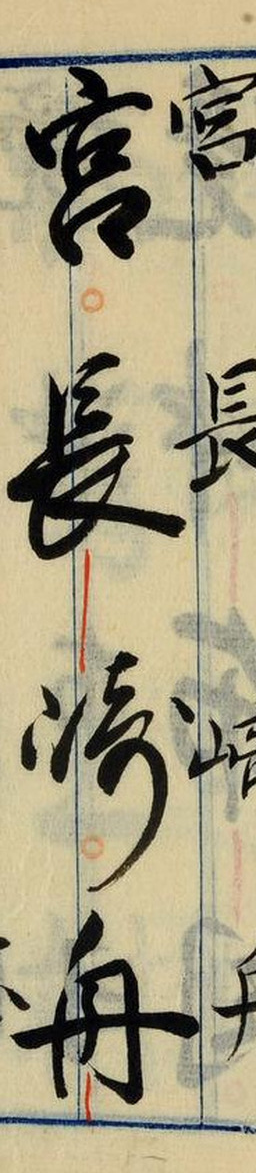宮長崎舟
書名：村名・連語
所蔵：福井県文書館 Fukui Prefectural Archives
